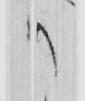人
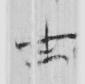才
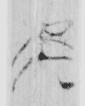{夨日}
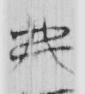弗
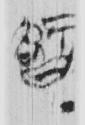智
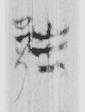邦
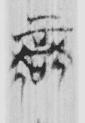獄
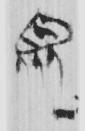眾
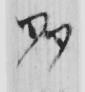多
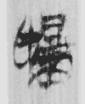婦
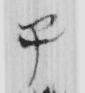子
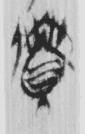{人舛亼貝}
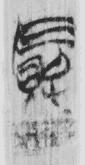{貝叚}
